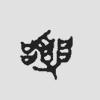𡄹
